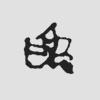爲
